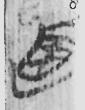廼
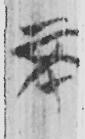不
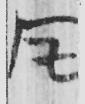厇
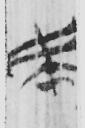民
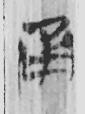甬
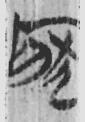戾
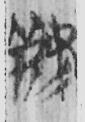{歺𦘔}
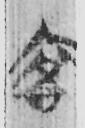{宀咎}
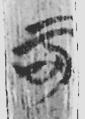可
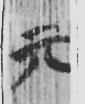亓
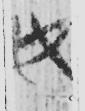女
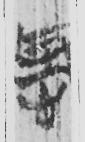怠
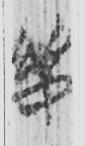𪪋（哉）
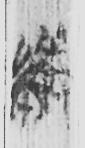絭
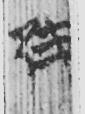隹
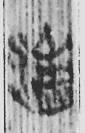{沈臼}
